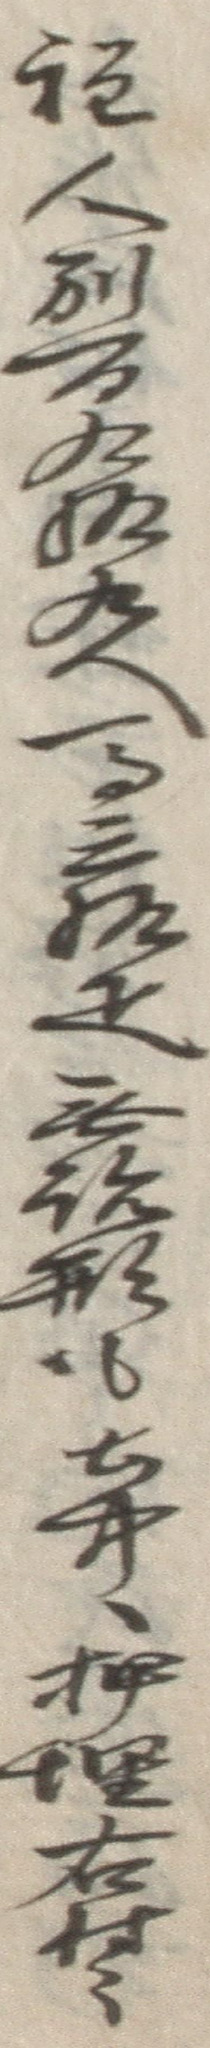程人別百九拾九人馬三拾疋無跡形も土中ㇸ押埋右村々
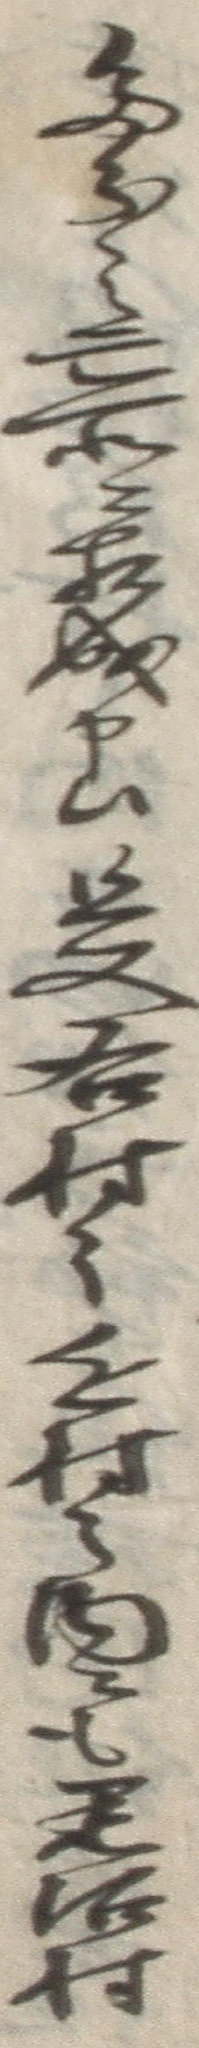多分之亡所二相成申候且又右村々近村之内二も黒沼村
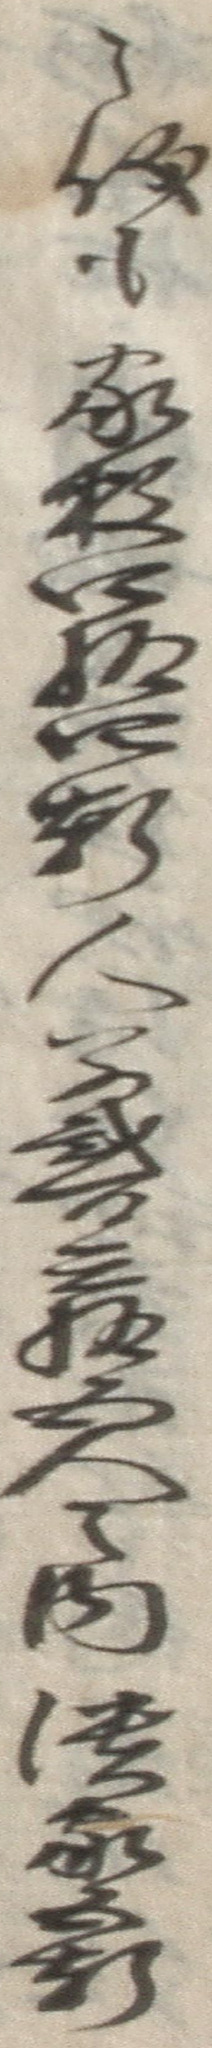之儀も家数四拾四軒人数弐百三拾五人之内潰家五軒
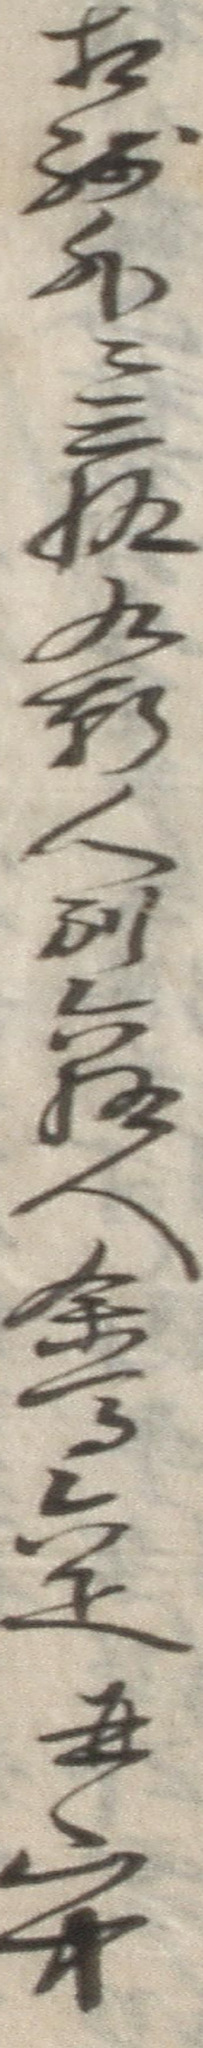相残外二三拾九軒人別六拾人余馬六疋并山中
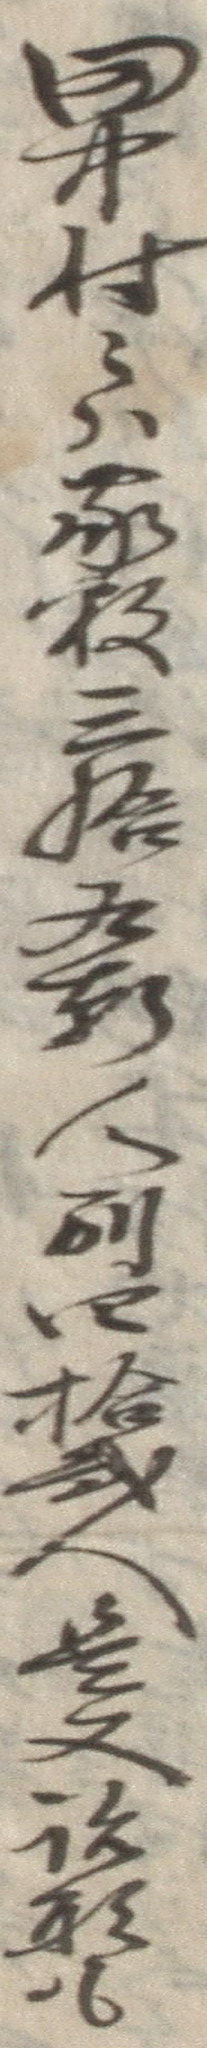田中村二ハ家数三拾九軒人別四拾弐人是又跡形も
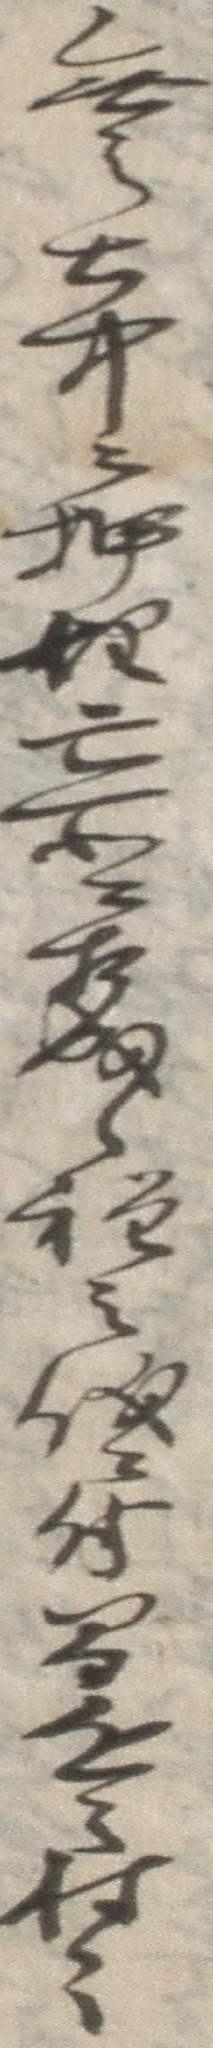無之土中に押埋亡所二相成候程之儀二付間近之村々
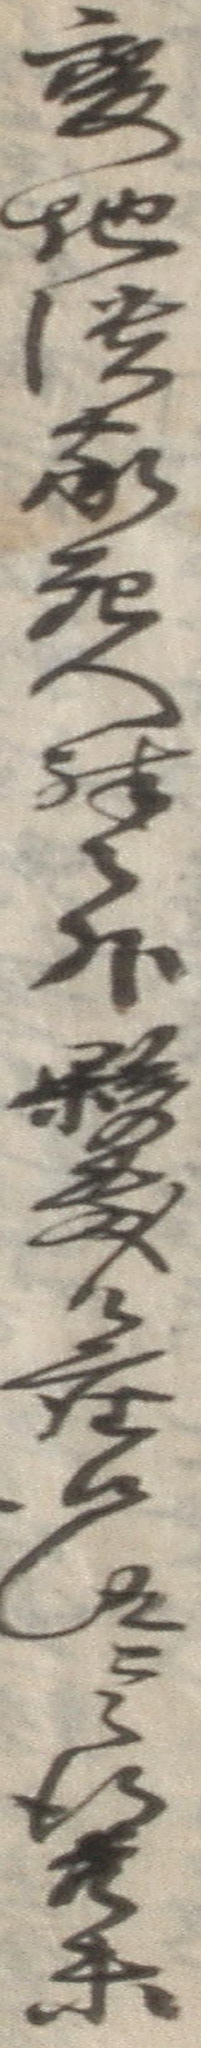変地潰家死人殊之外夥敷御座候趣二候得共未
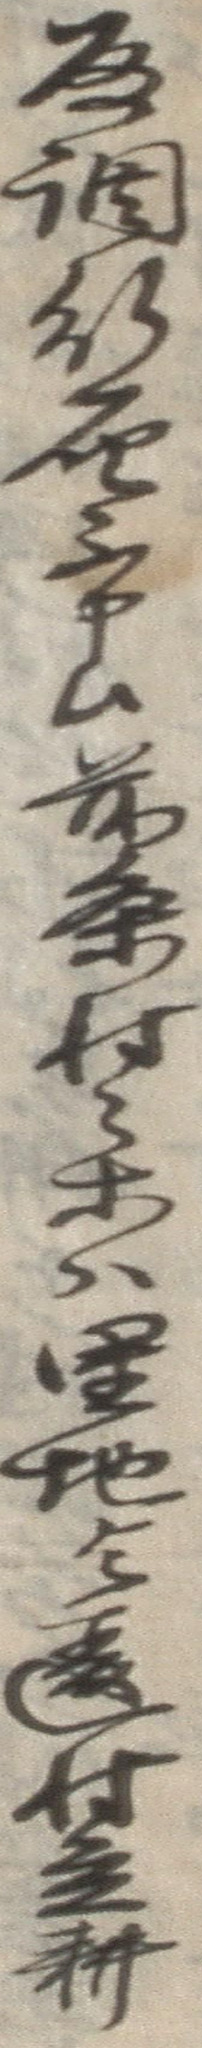取調行届不申候前条村々等ハ里地と違村立耕
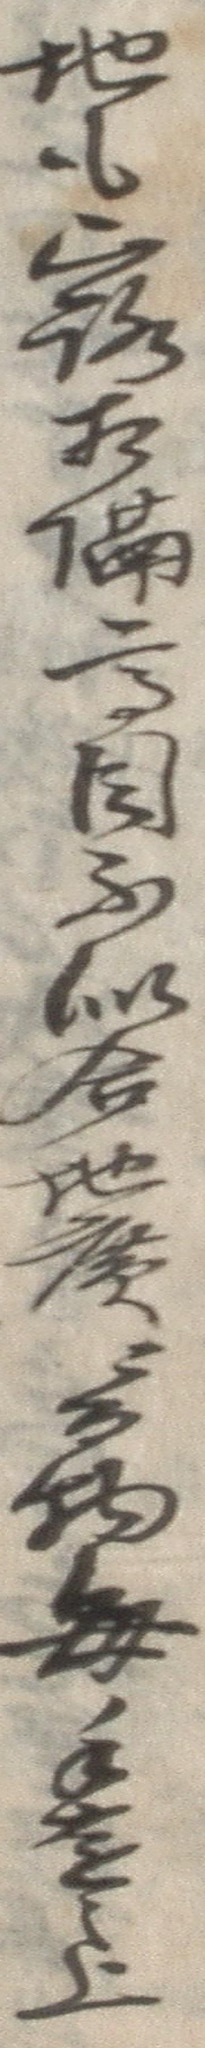地も山路相隔高目不似合地廣二而物事手遠之上
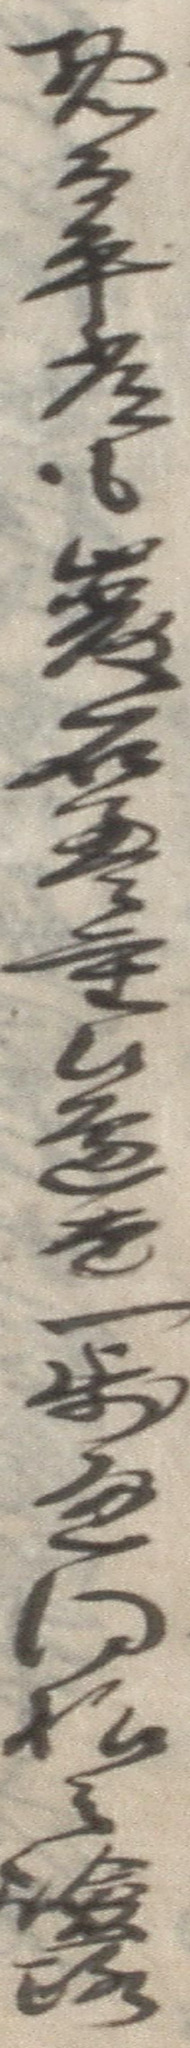惣而平常も厳石畳重候辺を一歩通同様之険路
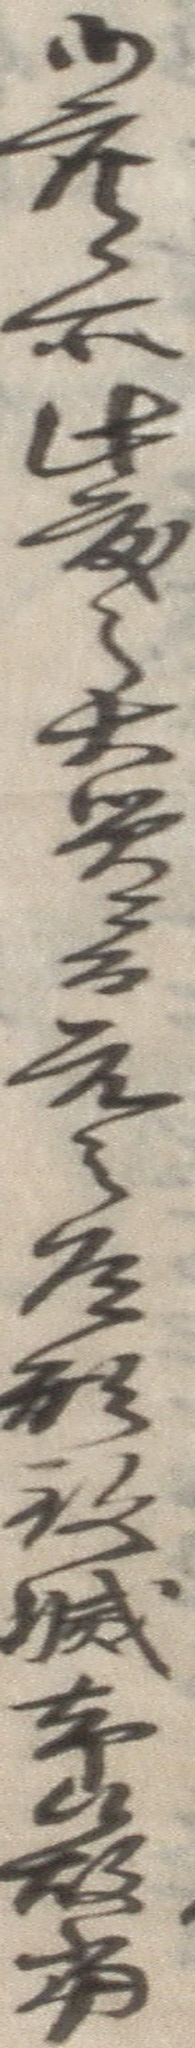御座候所此度之大災二而元之道形致滅却候故当
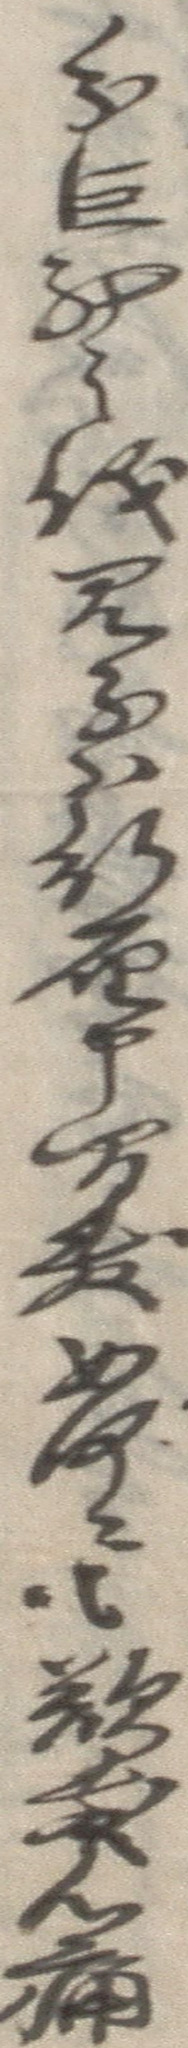分巨細之儀見分不行届申間敷如何二も歎敷心痛
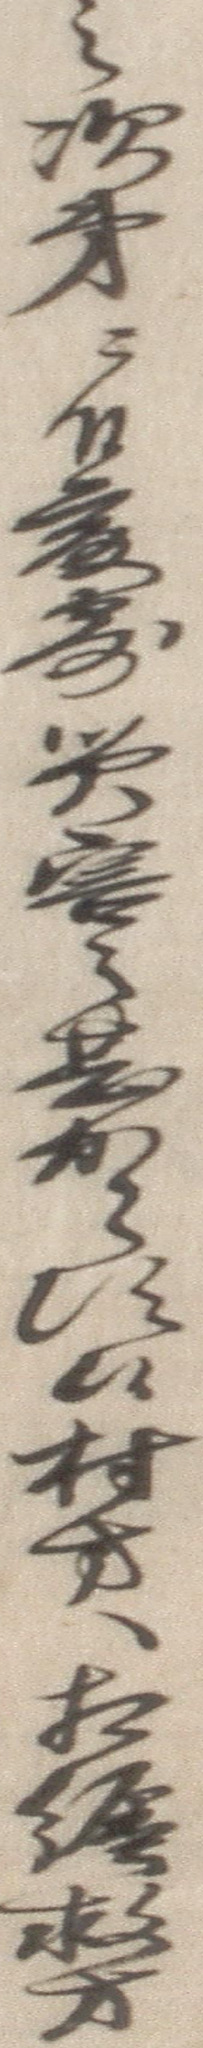之次第二付最寄災害之甚からず候村方ㇸ相纏救方
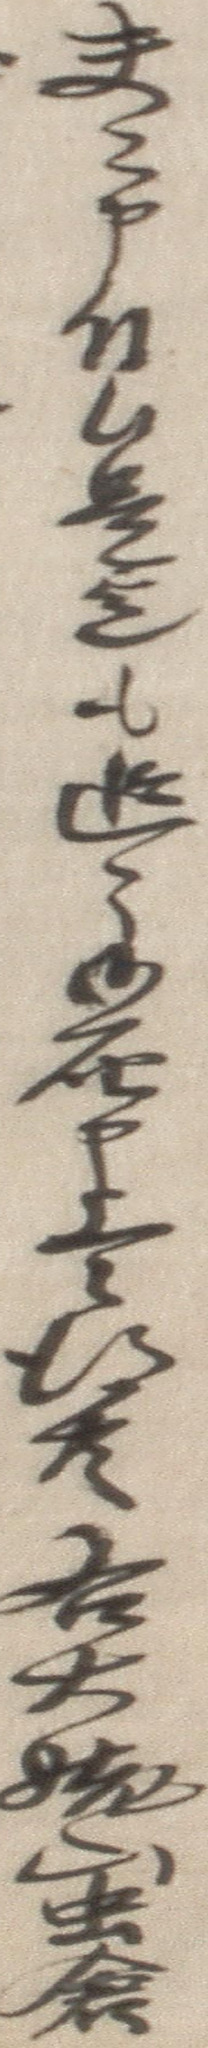夫々申付候是迄も追々御届申上候得共右大姥山虫倉
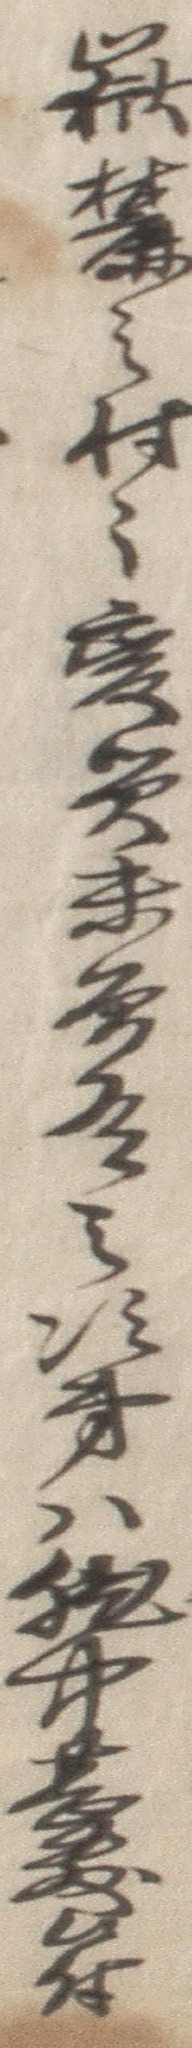嶽麓之村々変災未曾有之次第ハ就中甚敷候付
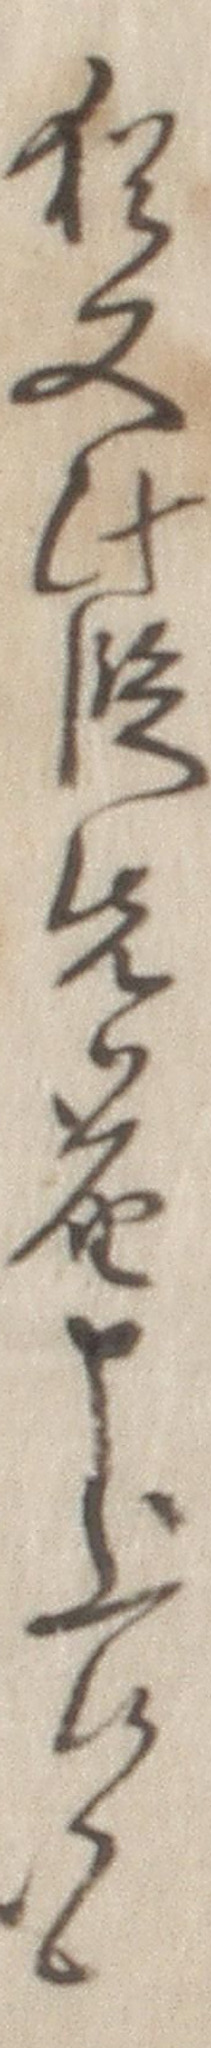猶又此段先御届申上候以上
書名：信州地震一件
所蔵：東京大学地震研究所図書室 Earthquake Research Institute Library, The University of Tokyo, JAPAN
